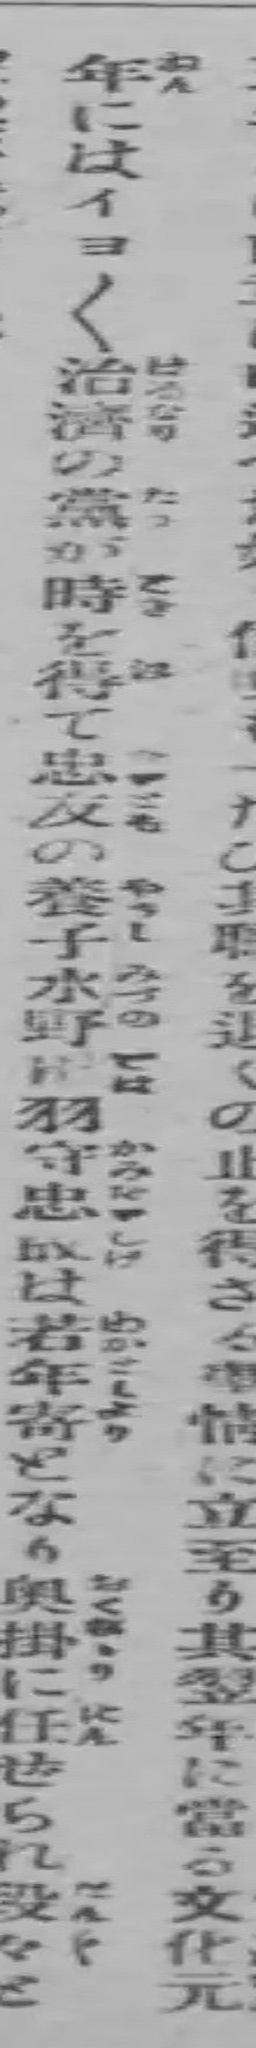水野忠成年にはイヨ〳〵治済の党が時を得て忠友の養子水野出羽守忠成は若年寄となり奥掛に任ぜられ段々と
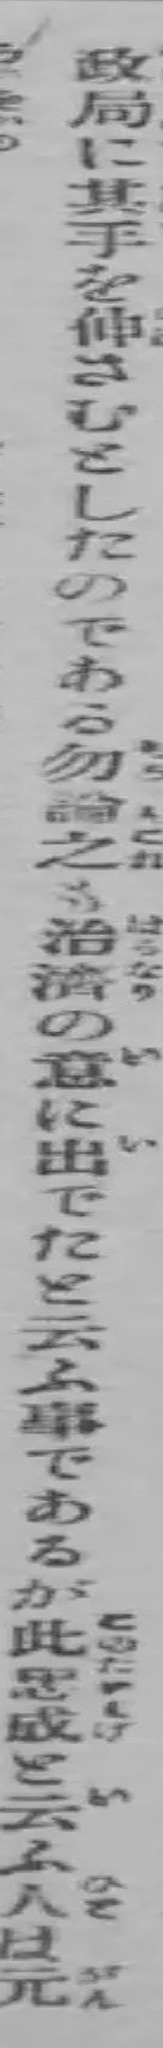政局に其手を伸さむとしたのである勿論之も治済の意に出でたと云ふ事であるが此忠成と云ふ人は元
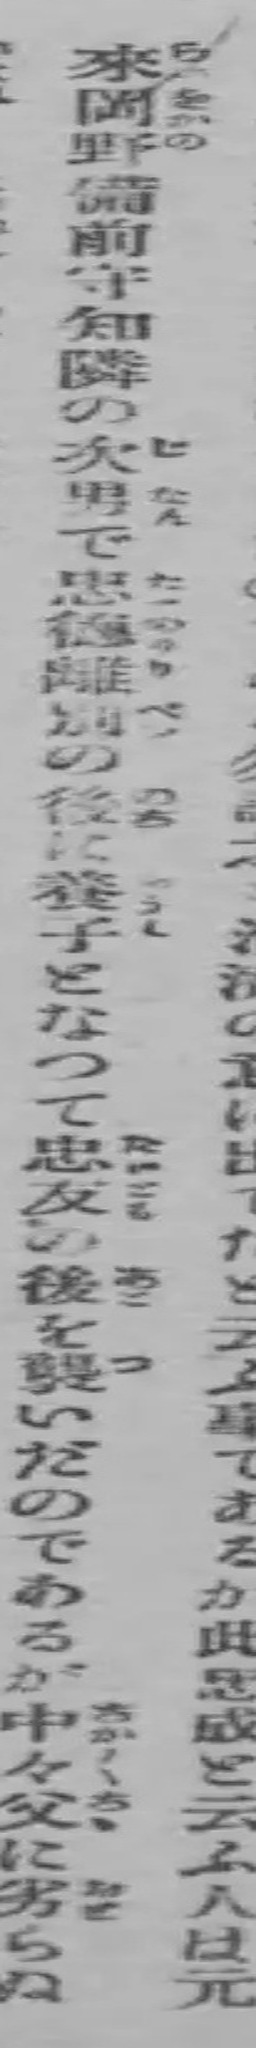来岡野備前守知隣の次男で忠徳離別の後に養子となつて忠友の後を襲いだのであるが中々父に劣らぬ
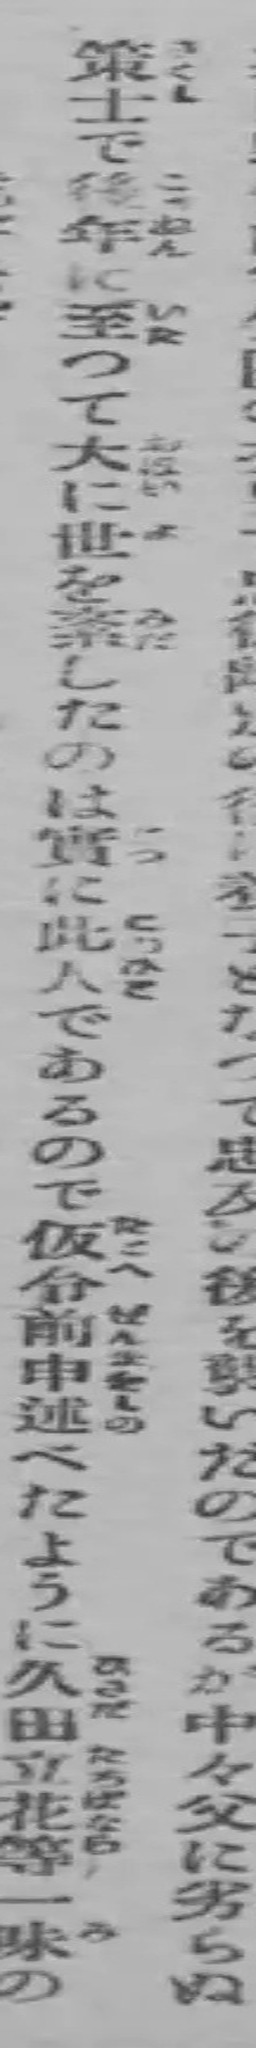策士で後年に至つて大に世を紊したのは実に此人であるので仮令前申述べたように久田立花等一味の
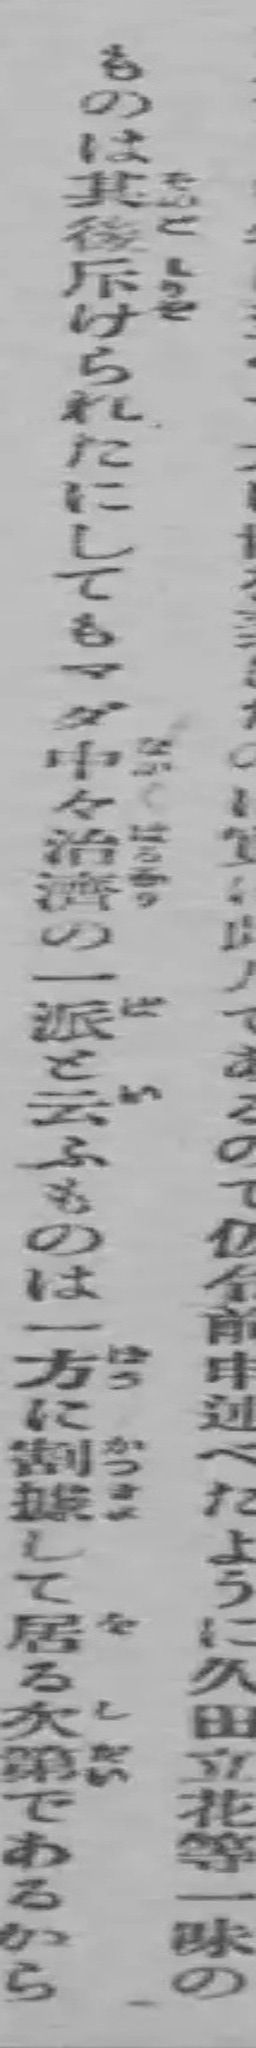ものは其後斥けられたにしてもマダ中々治済の一派と云ふものは一方に割拠して居る次第であるから
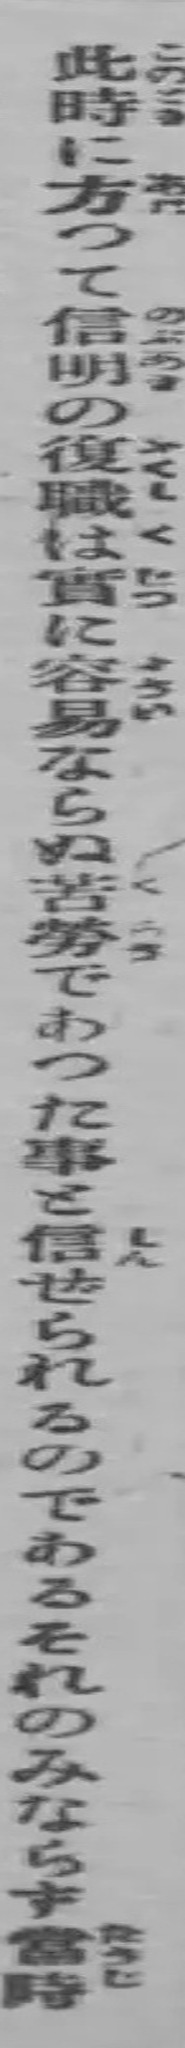此時に方つて信明の復職は実に容易ならぬ苦労であつた事と信ぜられるのであるそれのみならず当時
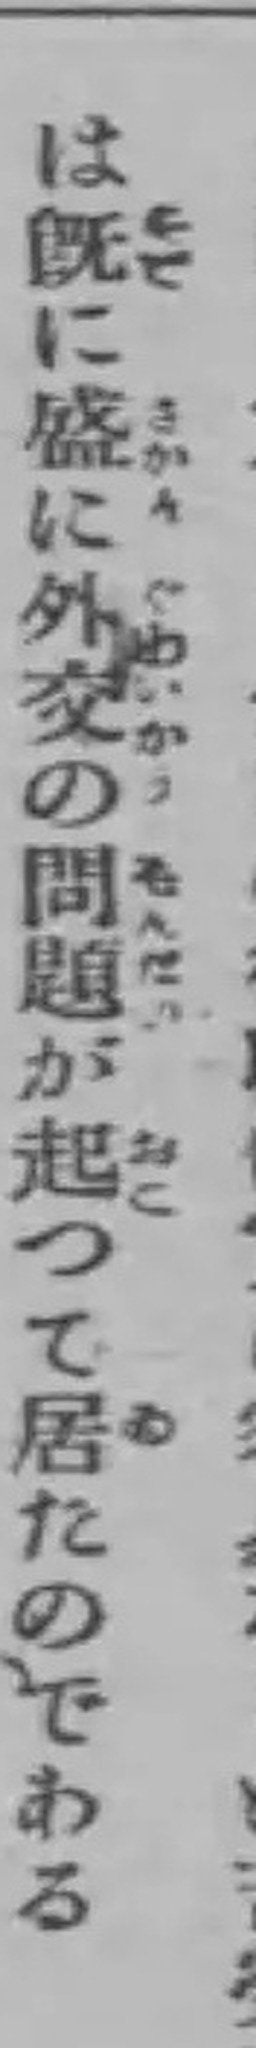は既に盛に外交の問題が起つて居たのである
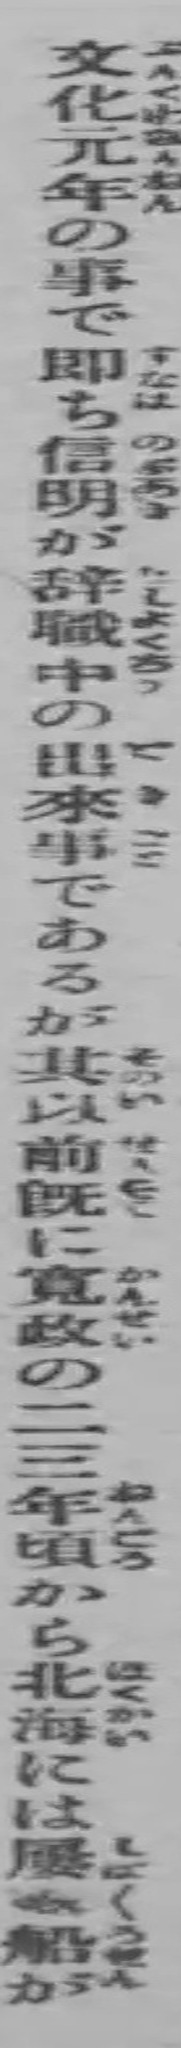文化元年の事で即ち信明が辞職中の出来事であるが其以前既に寛政の二三年頃から北海には屡々露船が
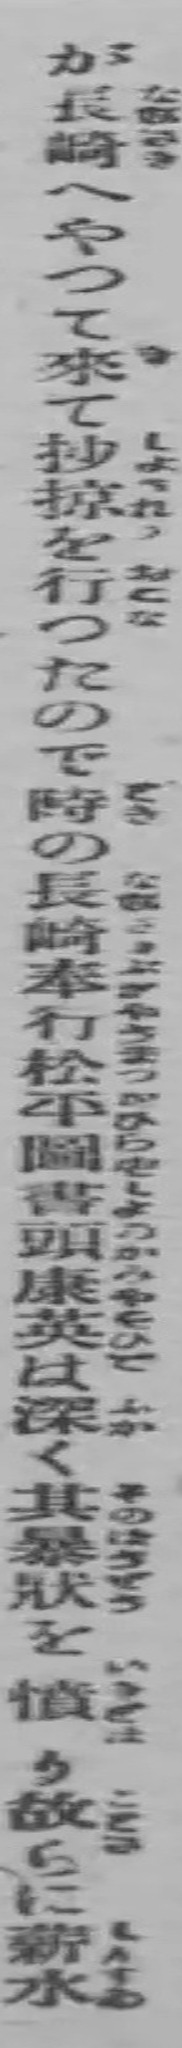が長崎へやつて来て抄掠を行つたので時の長崎奉行松平図書頭康英は深く其暴状を憤り故らに薪水
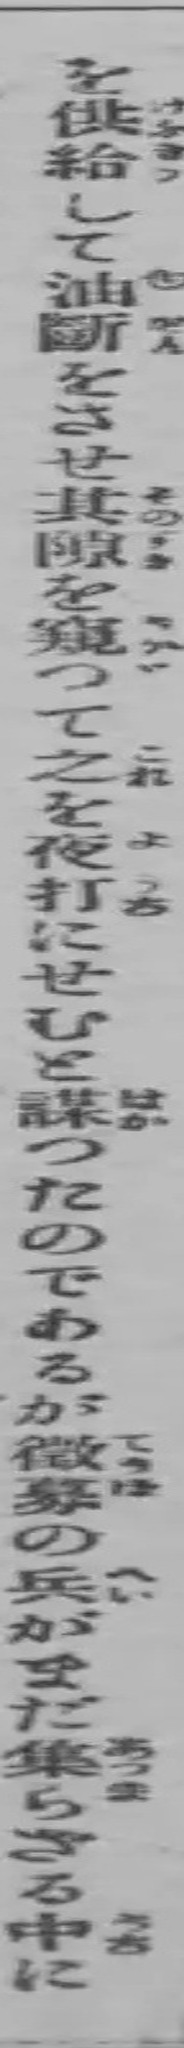を供給して油断をさせ其隙を窺つて之を夜打にせむと謀つたのであるが徴募の兵がまだ集らざる中に
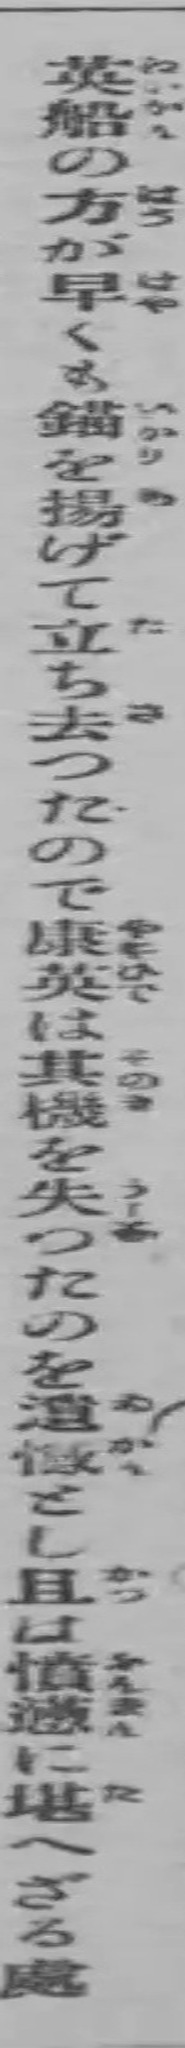英船の方が早くも錨を揚げて立ち去つたので康英は其機を失つたのを遺憾とし且は憤懣に堪へざる処
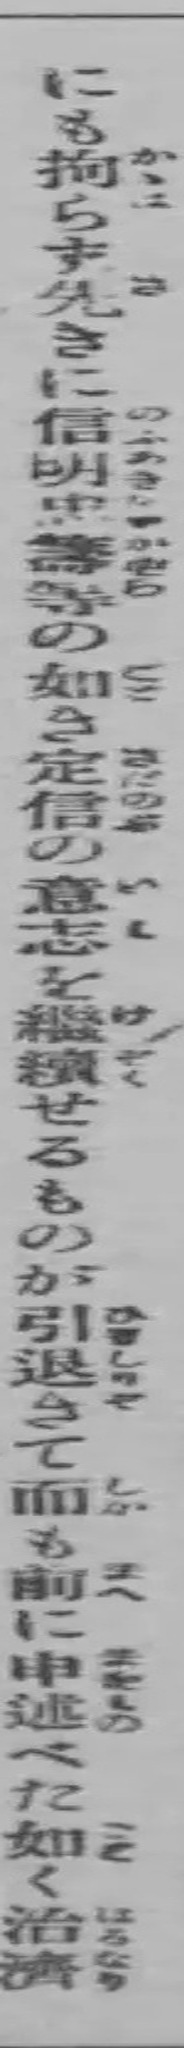にも拘らず先きに信明忠籌等の如き定信の意志を継続せるものが引退きて而も前に申述べた如く治済
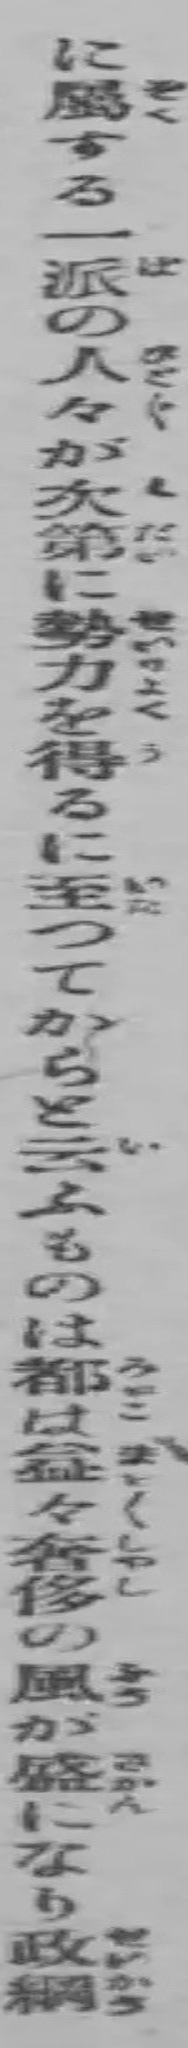に属する一派の人々が次第に勢力を得るに至つてからと云ふものは都は益々奢侈の風が盛になり政綱
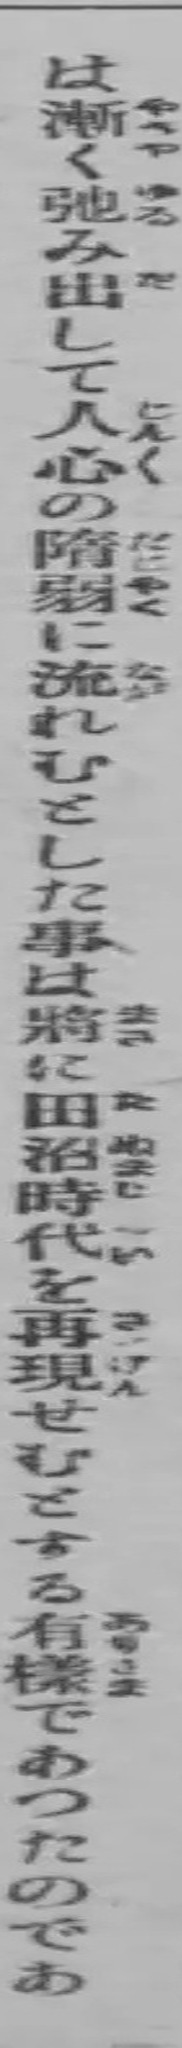は漸く弛み出して人心の隋弱に流れむとした事は将に田沼時代を再現せむとする有様であつたのであ
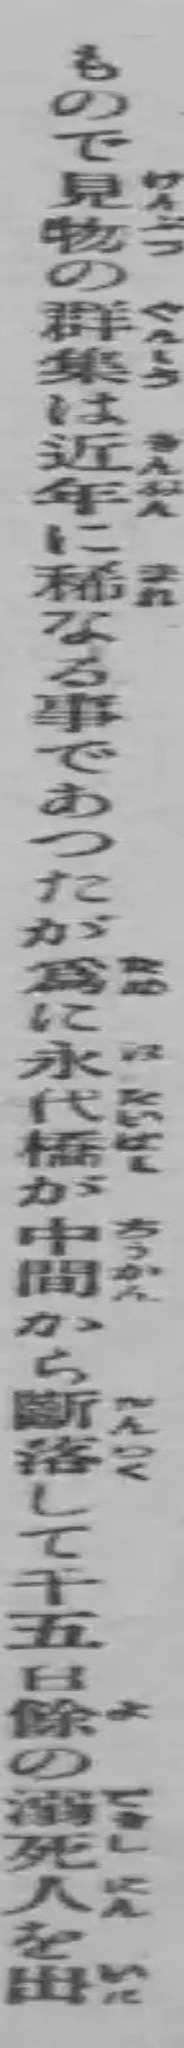もので見物の群集は近年に稀なる事であつたが為に永代橋が中間から断落して千五百余の溺死人を出
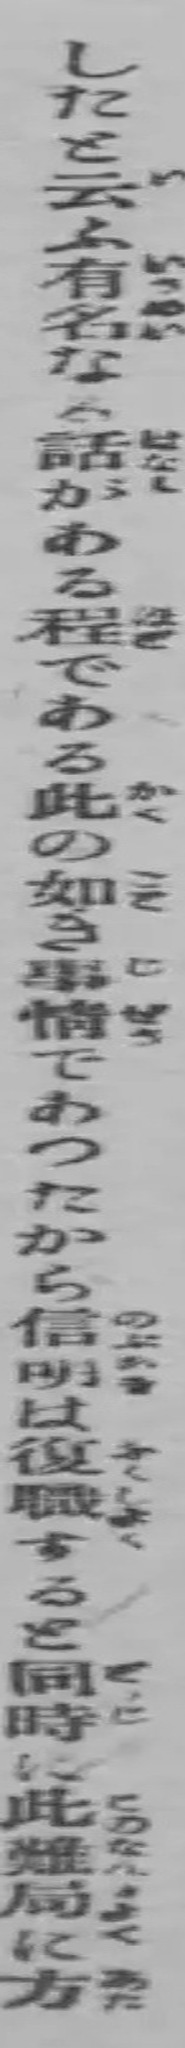したと云ふ有名なる話がある程である此の如き事情であつたから信明は復職すると同時に此難局に方
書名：豊橋市史談
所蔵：国立国会図書館 National Diet Library, JAPAN
